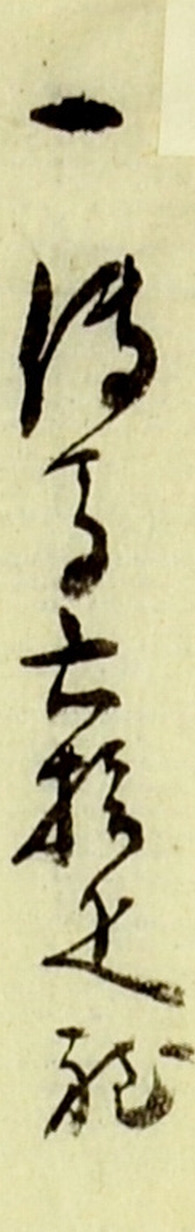一伝馬六拾疋程
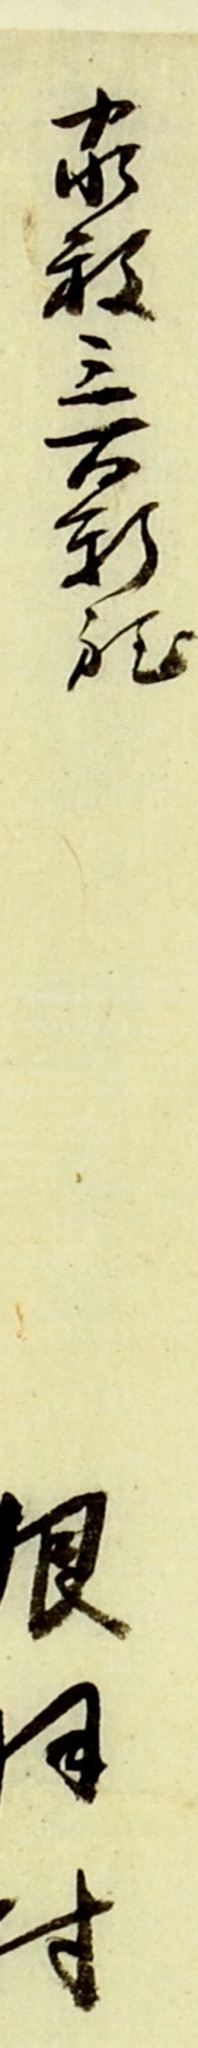一家数三万軒程根羽村
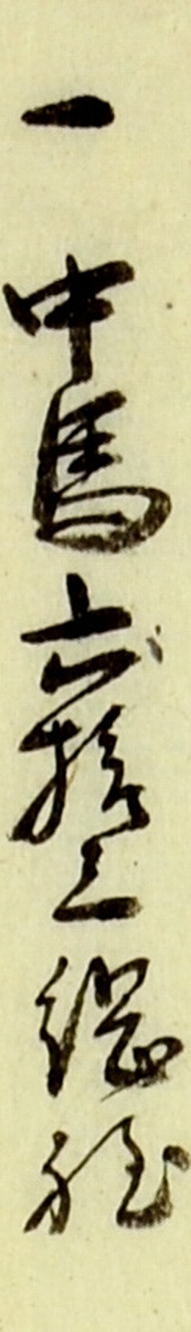一中馬六拾三綱程
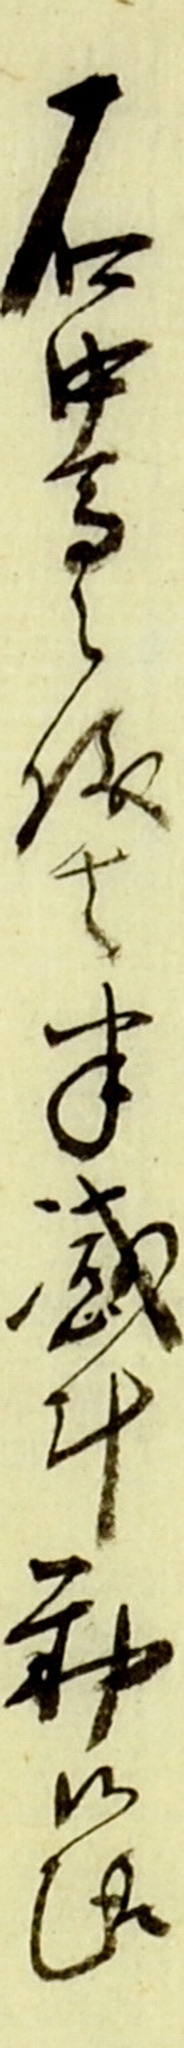右中馬之儀者半減計勤候趣
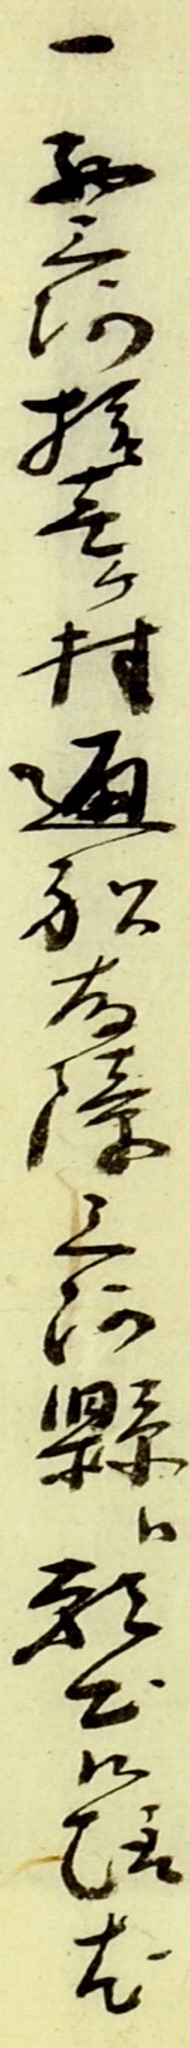一西三河拾壱ケ村通船故障三河県江願出候趣尤
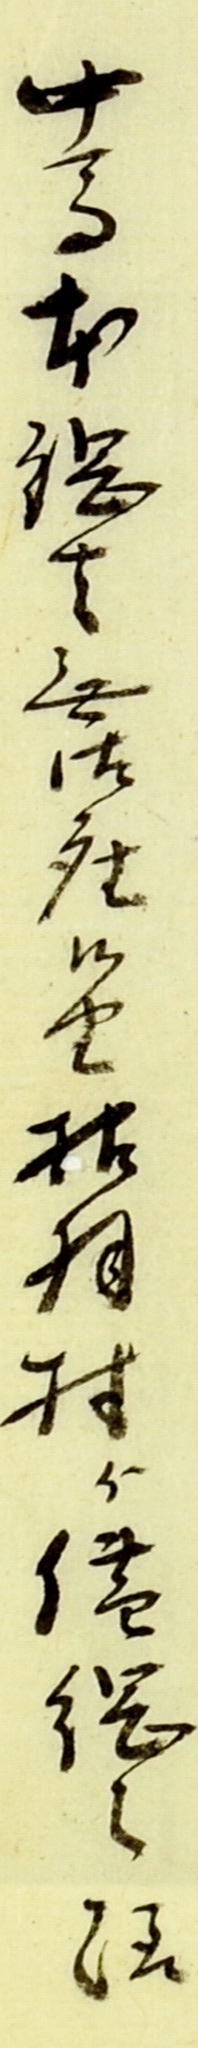中馬本綱者無御座候由根羽村ヨリ借綱之法

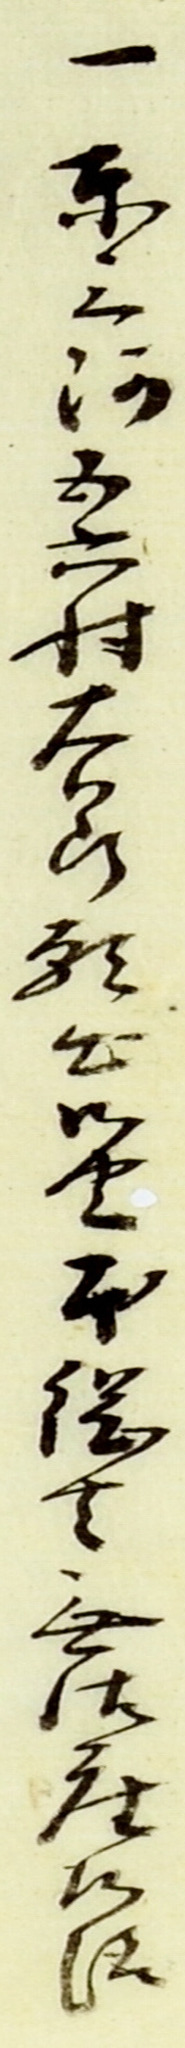一東三河五六村右同断願出候由本綱者無御座候様
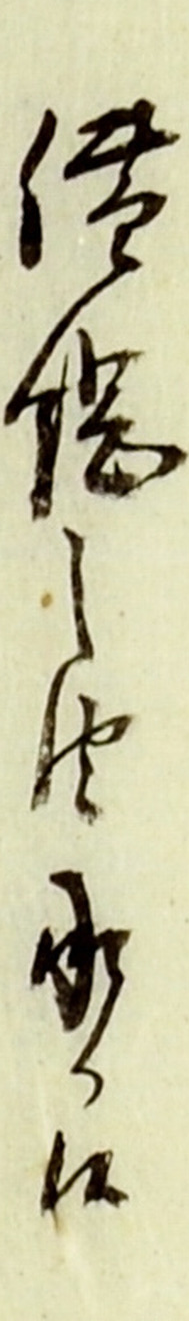借綱之由承り候
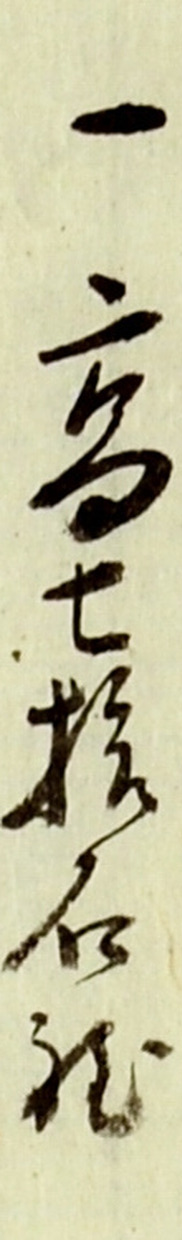一高七拾石程
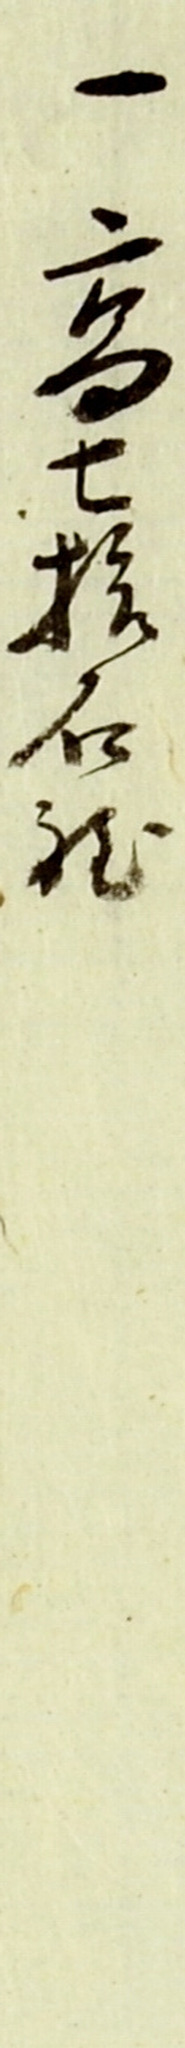一高七拾石程
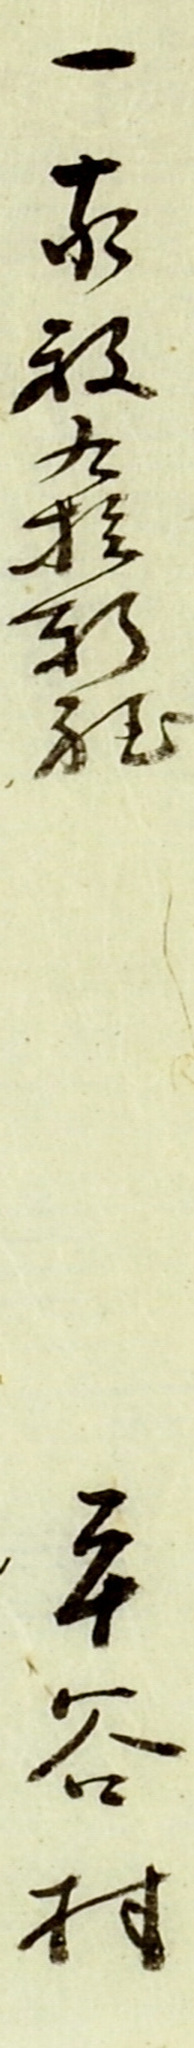一家数九拾軒程平谷村
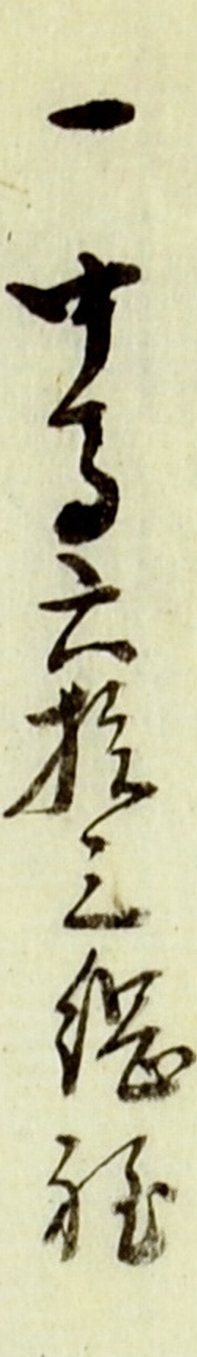一中馬六拾三綱程
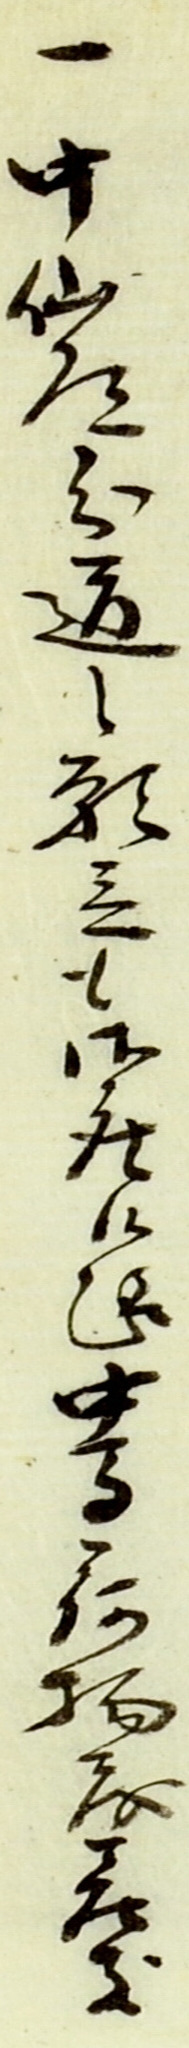一中仙道分道之願立も御座候趣中馬荷物茂差支
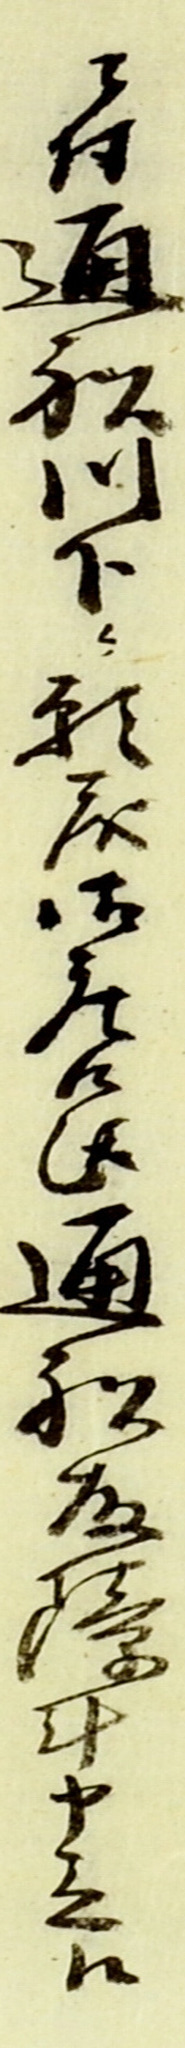ニ付通船川下候願茂御差候趣通船故障申立候
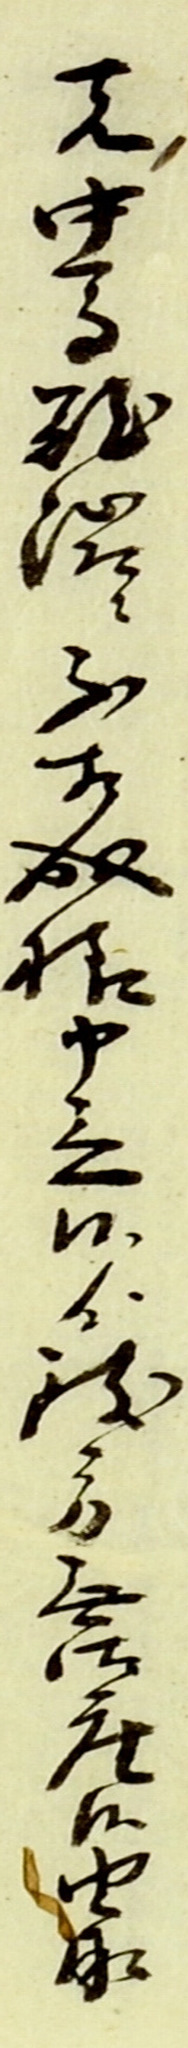元中馬難渋ニ不相成様申立候ゟ致方無御座候由承
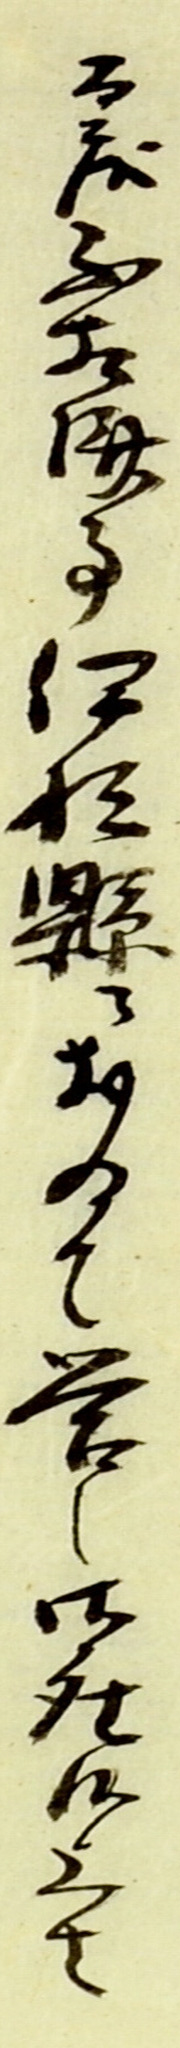而茂不相済事伊那県ニおゐて営之御座候上者
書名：調査報告書
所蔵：伊那市立高遠町図書館・合同会社AMANE
